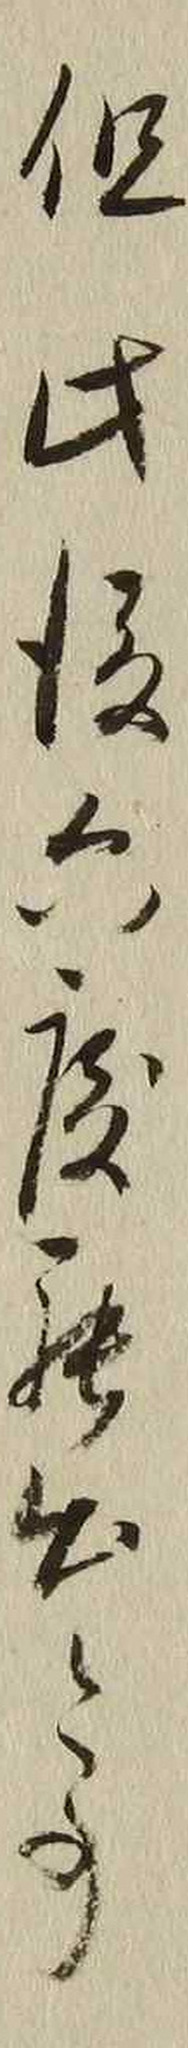但此後六度罷出候事
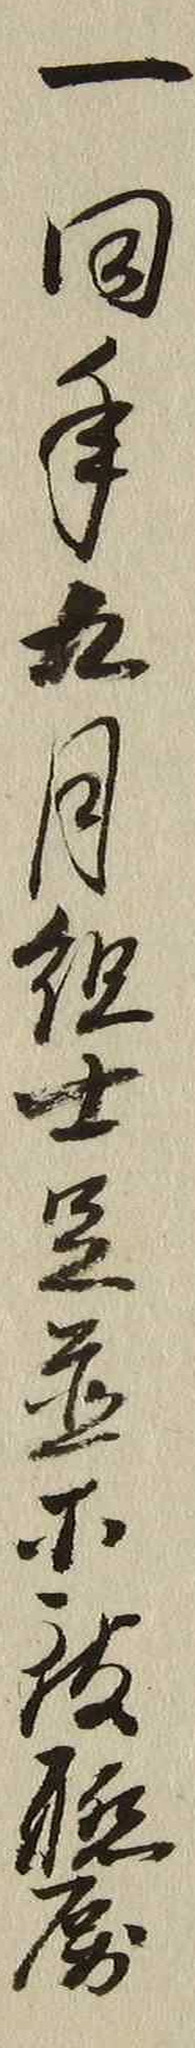一同年九月組士足並等致聯属
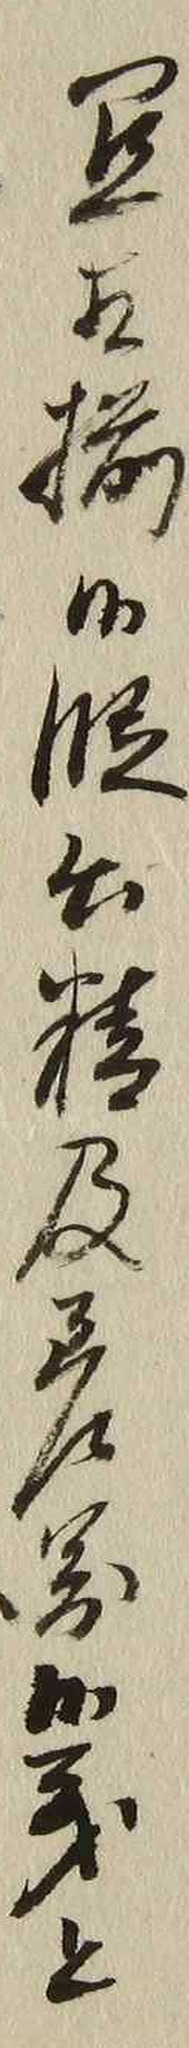宜相揃候段出精及差図候義と
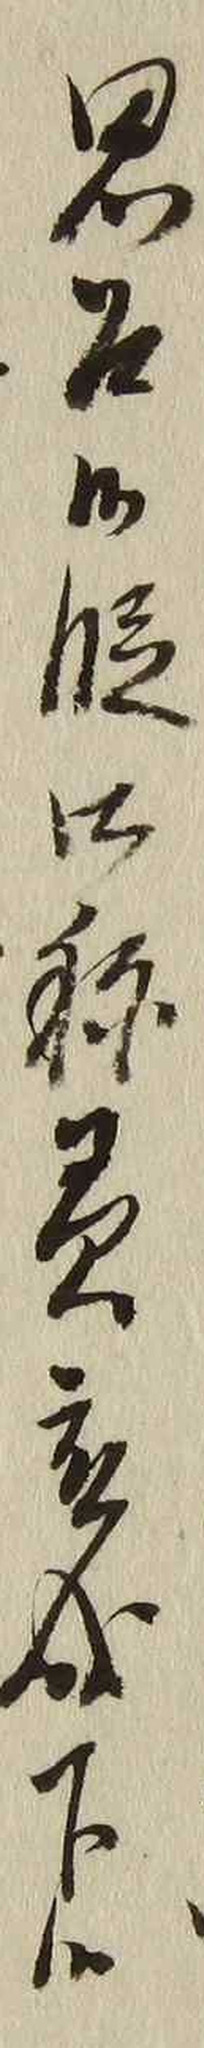思召候段御称美被成下候
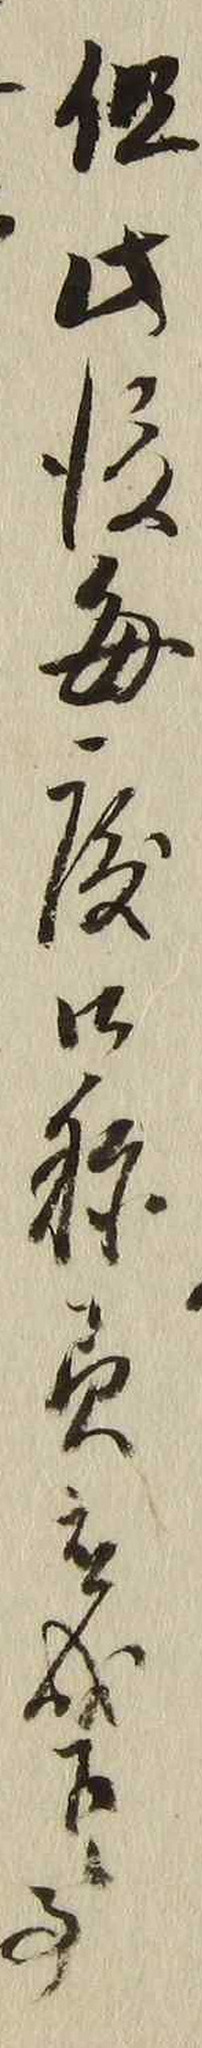但此後毎度御称美被成下候事
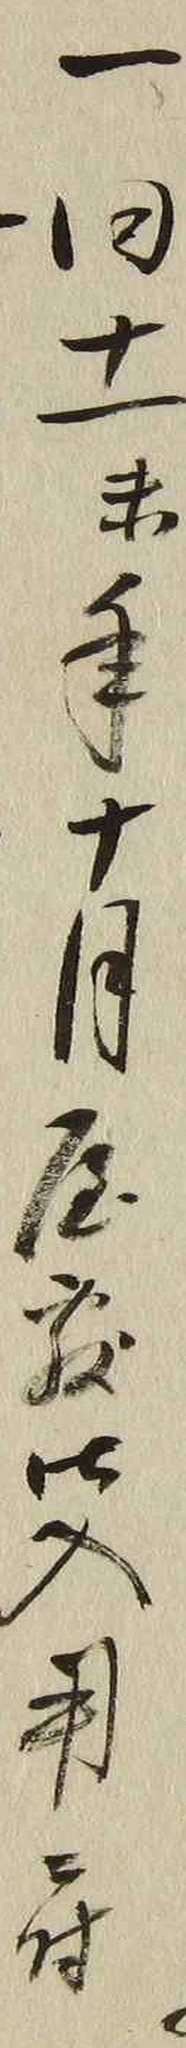一同十一未年十月屋敷御入用ニ付
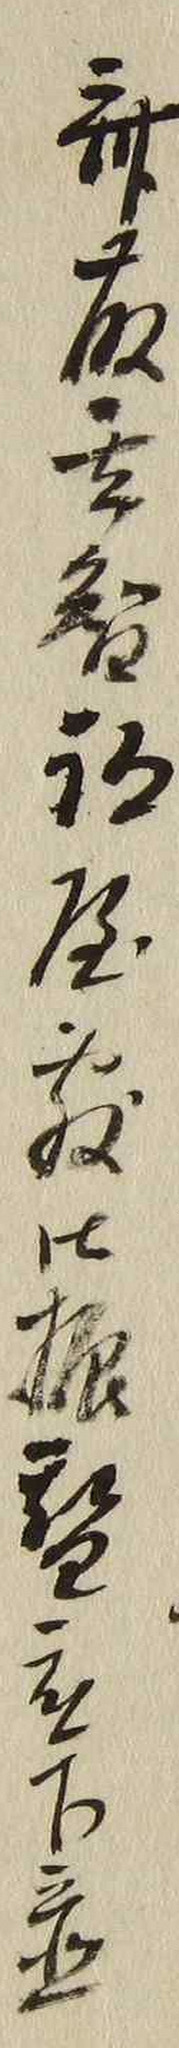斎藤玄智跡屋敷御振替被下置
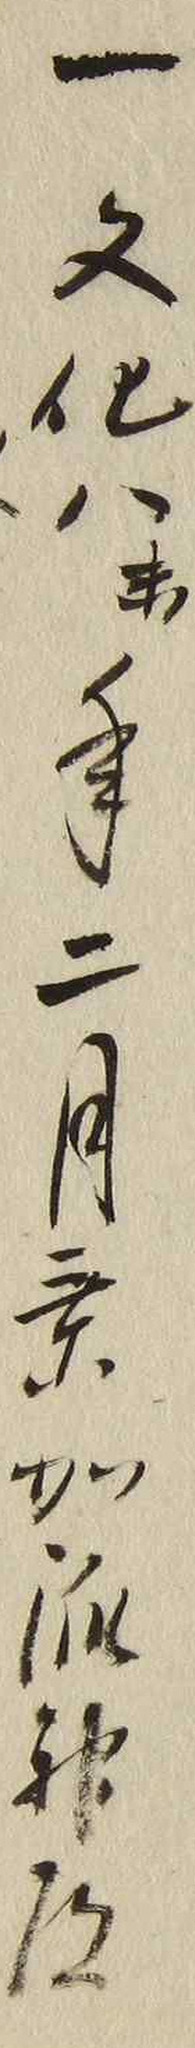一文化八未年二月垂加派神道
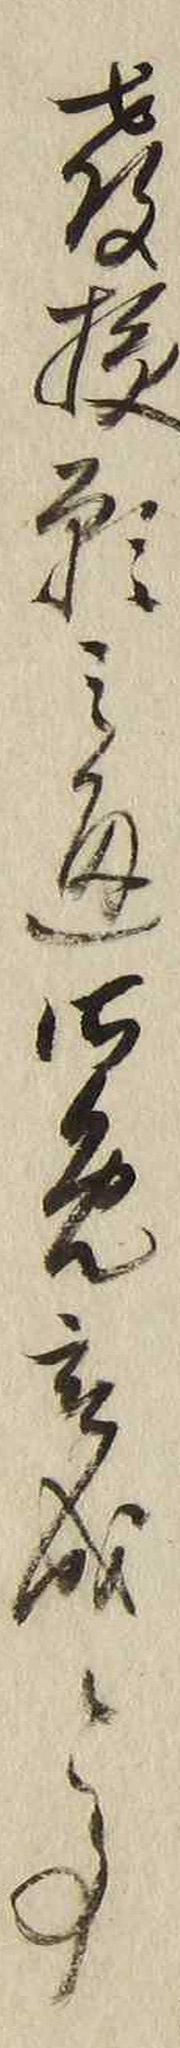教授願之通御免被成候事

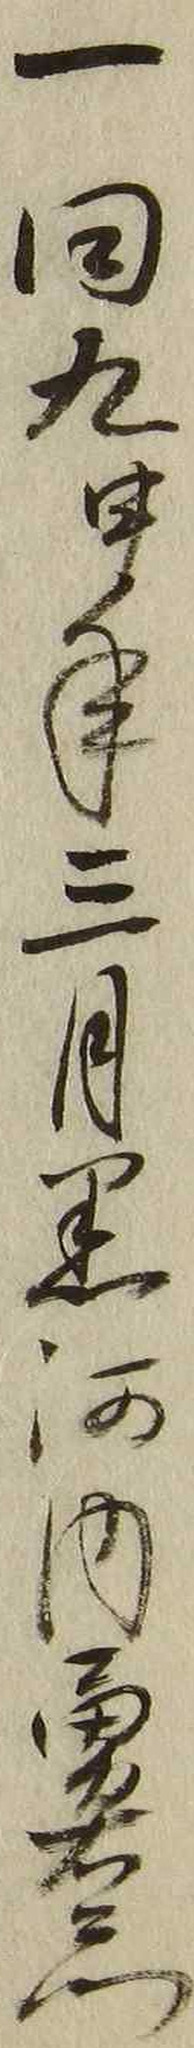一同九申年三月黒河内勇右衛門
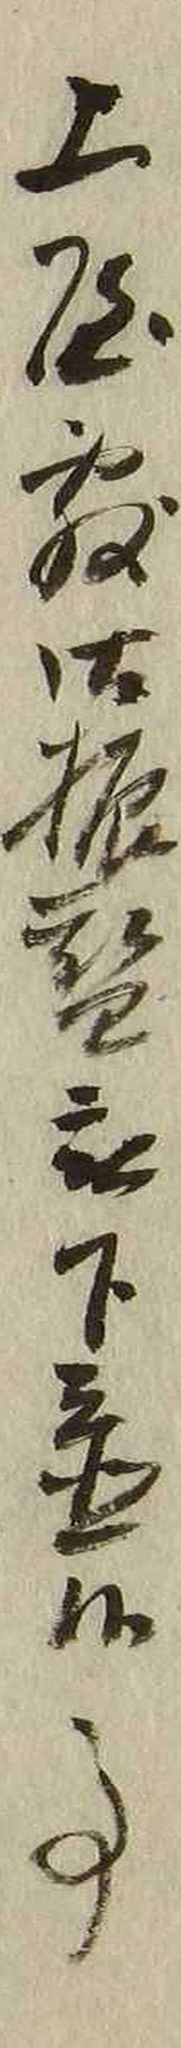上屋敷御振替被下置候事
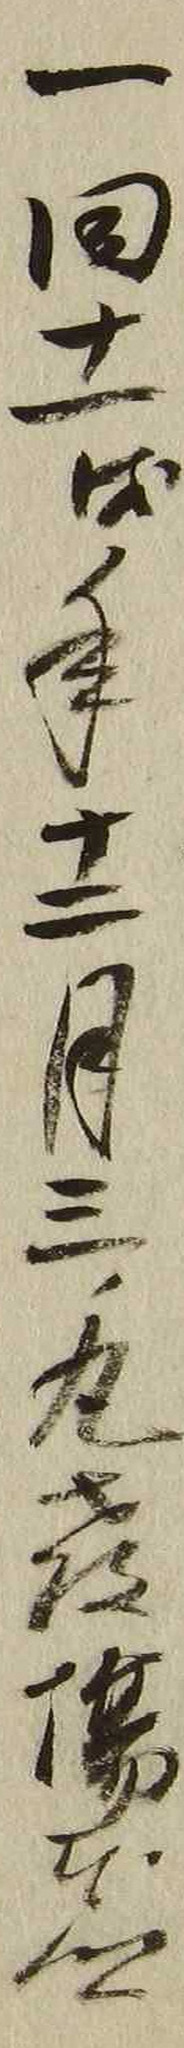一同十一戌年十二月三ノ丸教場本郷
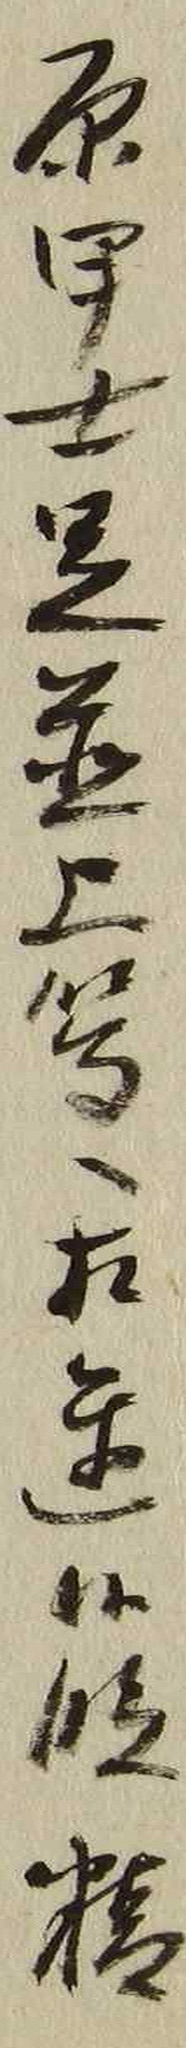原甲士足並上等へ相達候段精
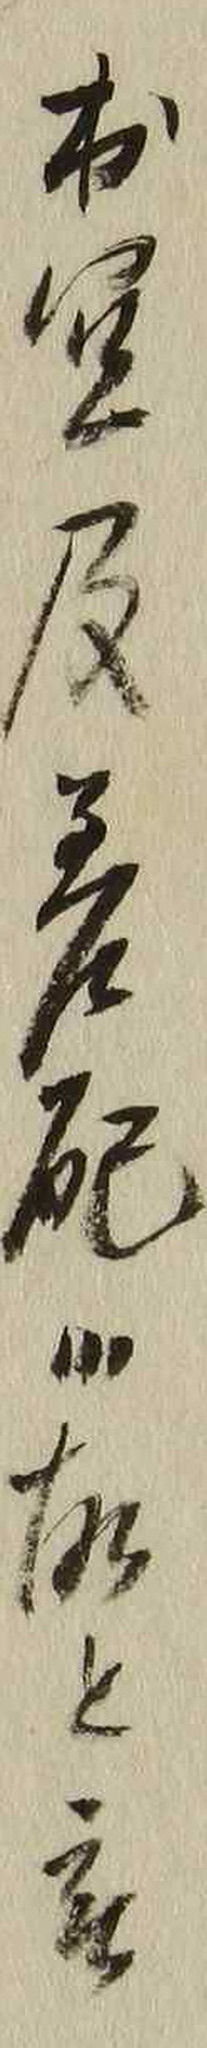出宜及差配御候故と被
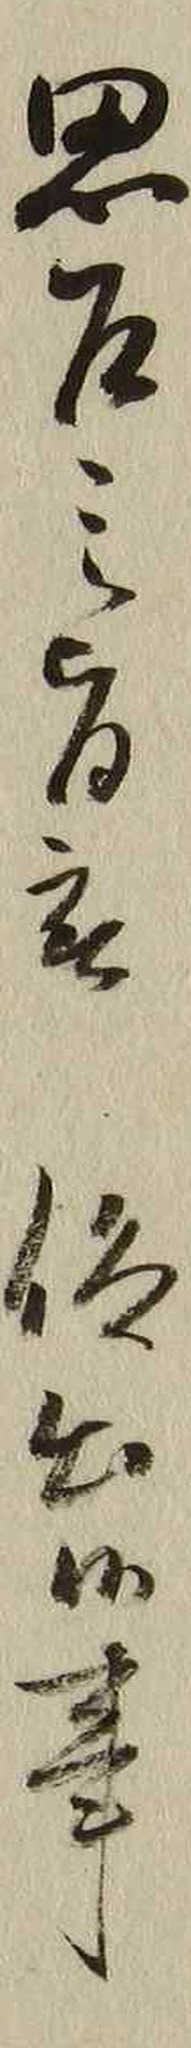思召之旨被仰出候事
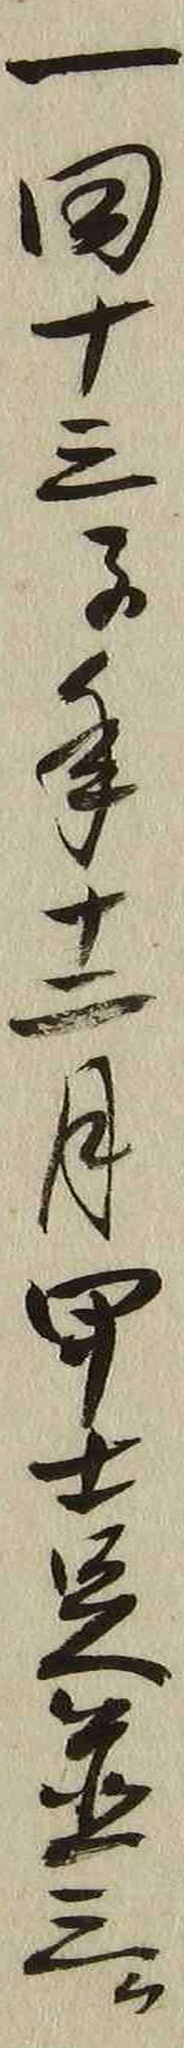一同十三子年十二月甲士足並三ケ
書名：諸士系譜　巻之355　す之部5
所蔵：会津若松市立会津図書館
